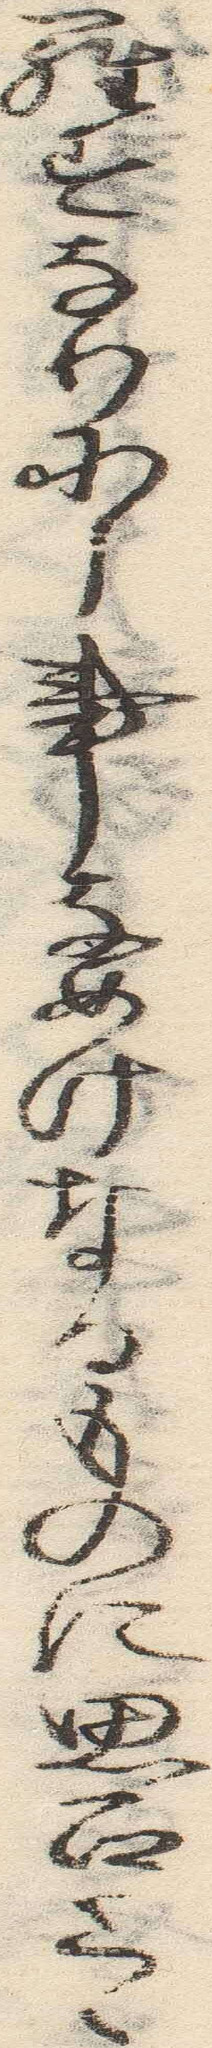らすなりにし事なめけなるものに思召とゝ
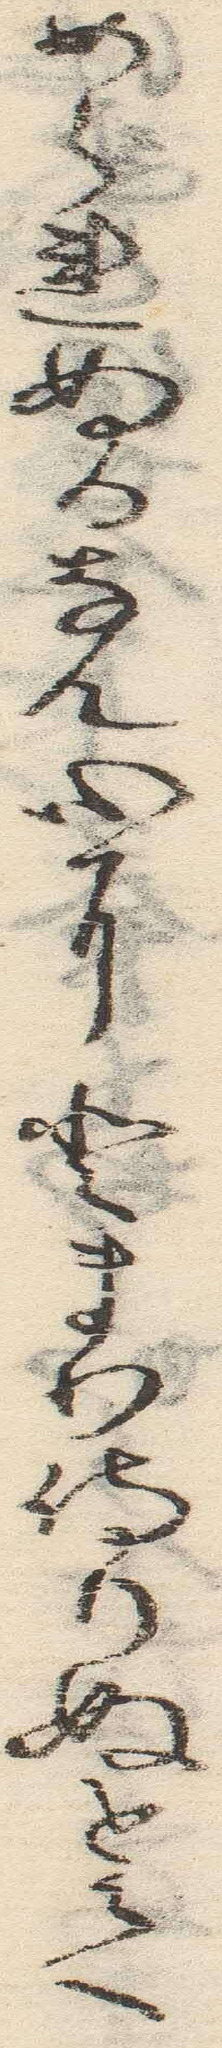められぬるなん心にとまり侍りぬとて
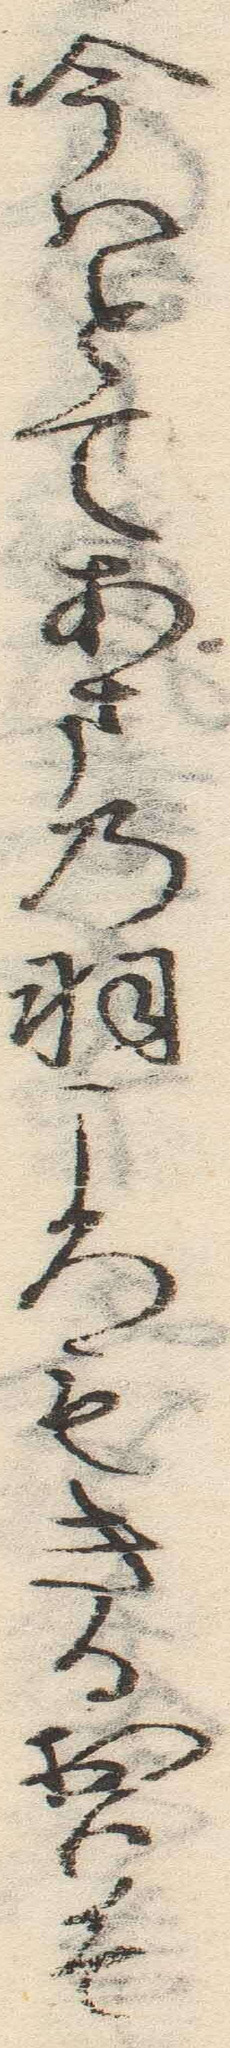今はとてあまの羽ころもきるおりそ
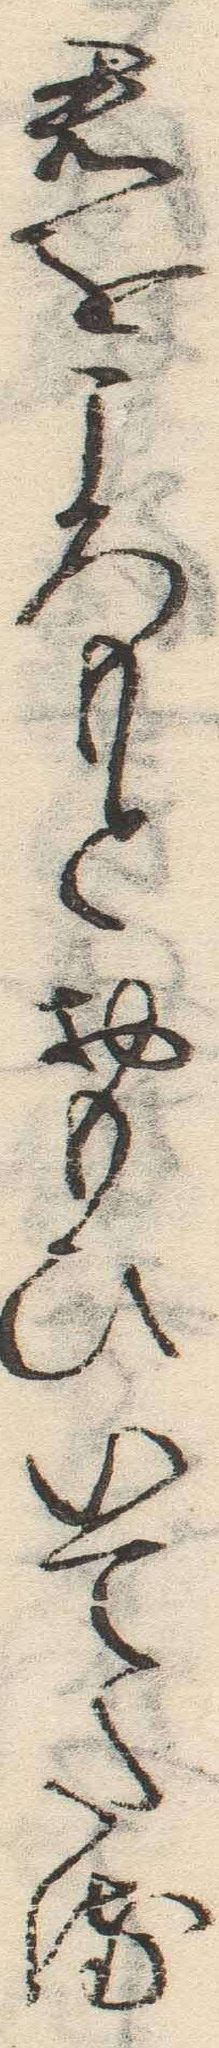君をころもとおもひいてたる
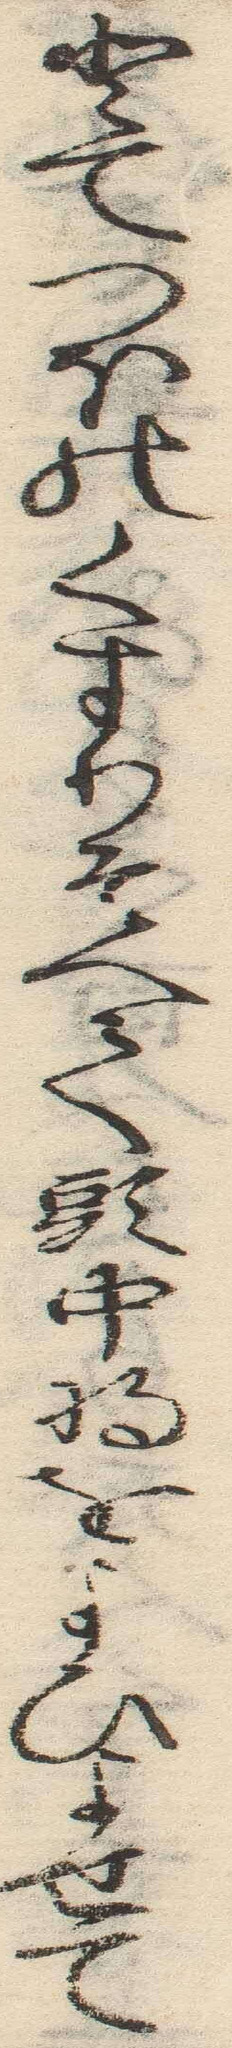とてつほのくすりそへて頭中将をよひよませ
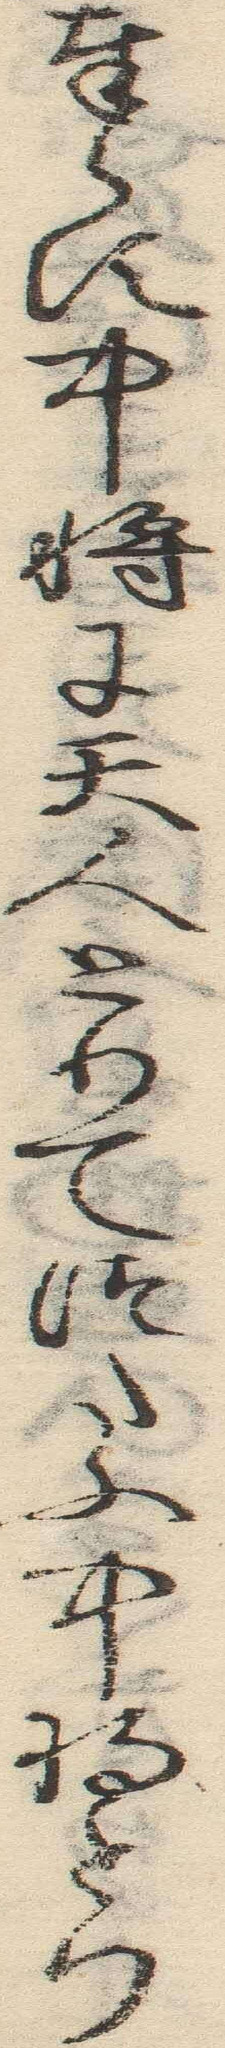奉らす中将に天人とりてつたふ中将とり
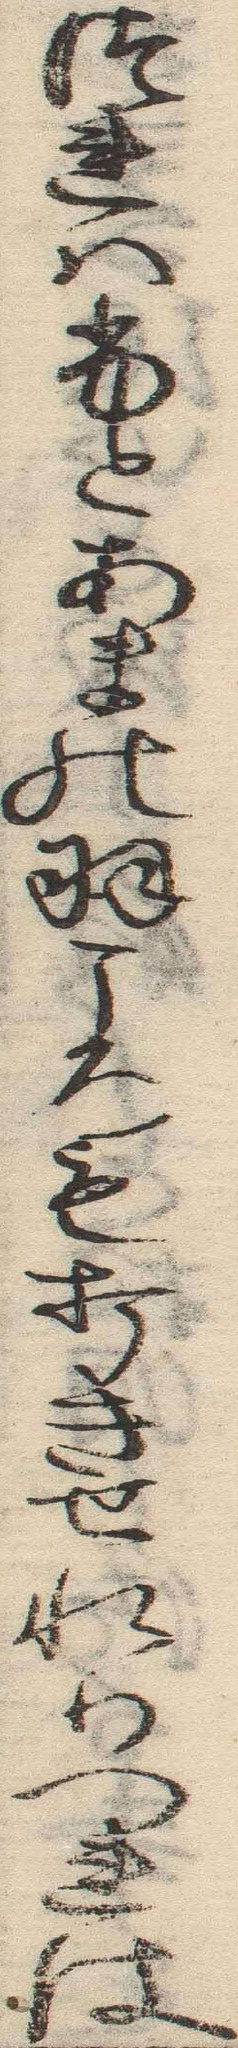つれはふとあまの羽ころも打きせ承りつれは

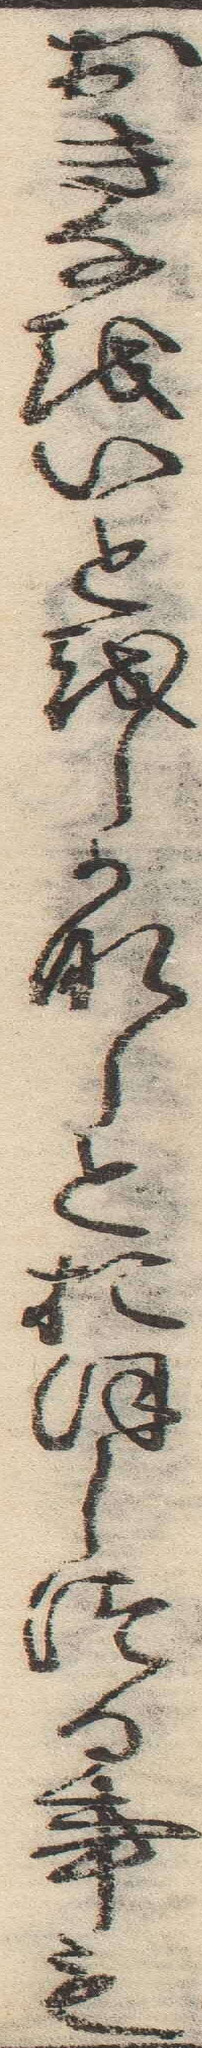をきなをいとをしかなしとおほしつる事も
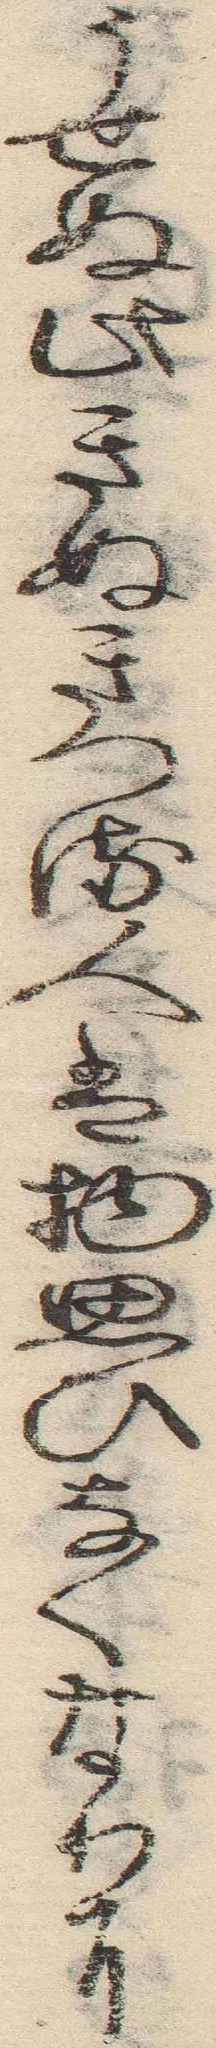うせぬ此きぬきつる人は物思ひなくなりに
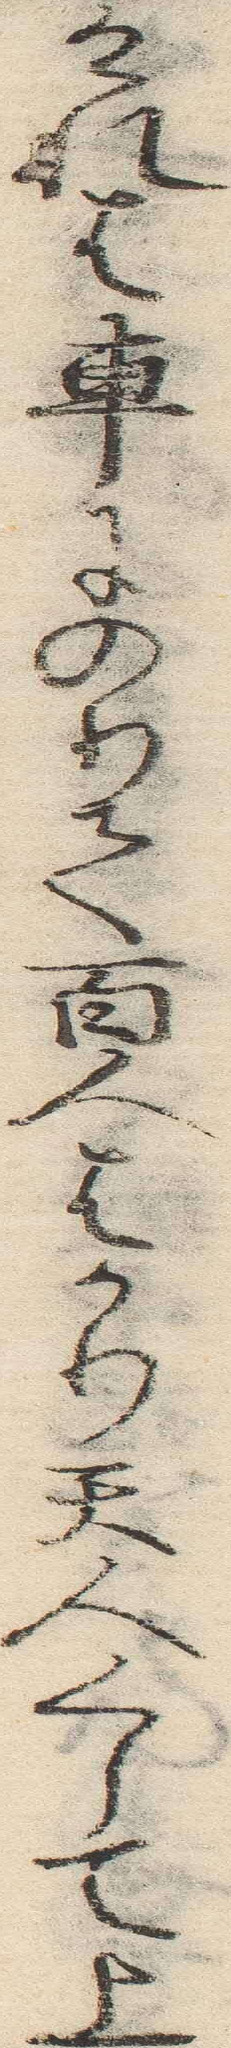けれは車にのりて百人はかり天人くして上
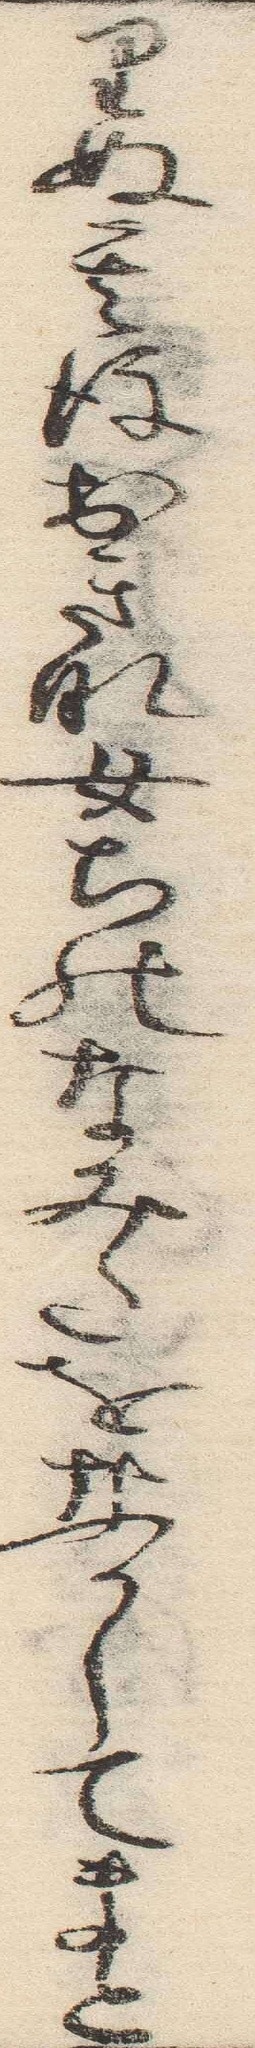りぬ其後おきな女ちのなみたをなかしてまと
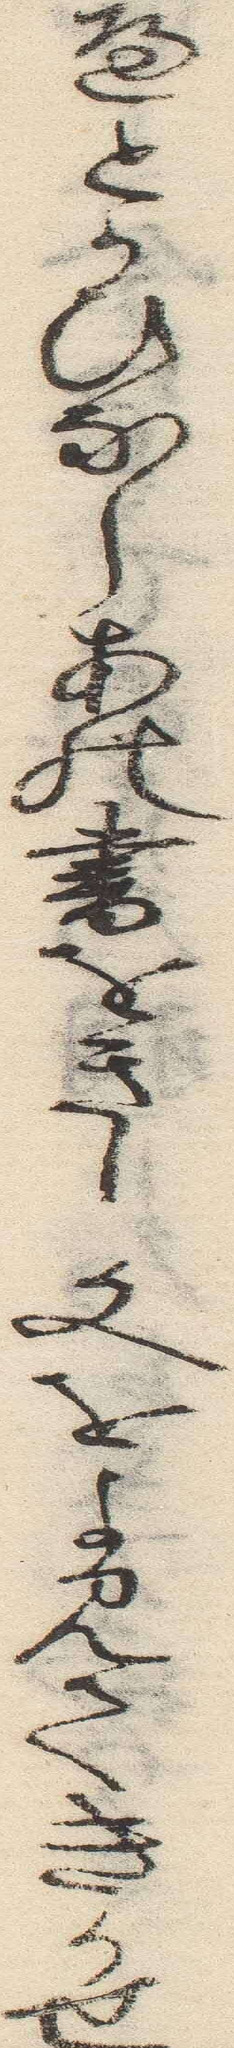へとかひなしあの書をきし文をよみきかせ
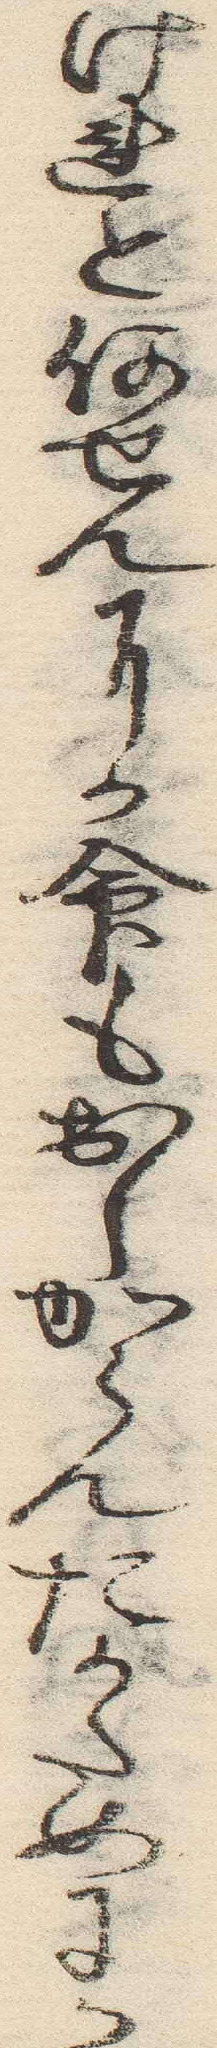けれと何せんにか命もおしからんたかため
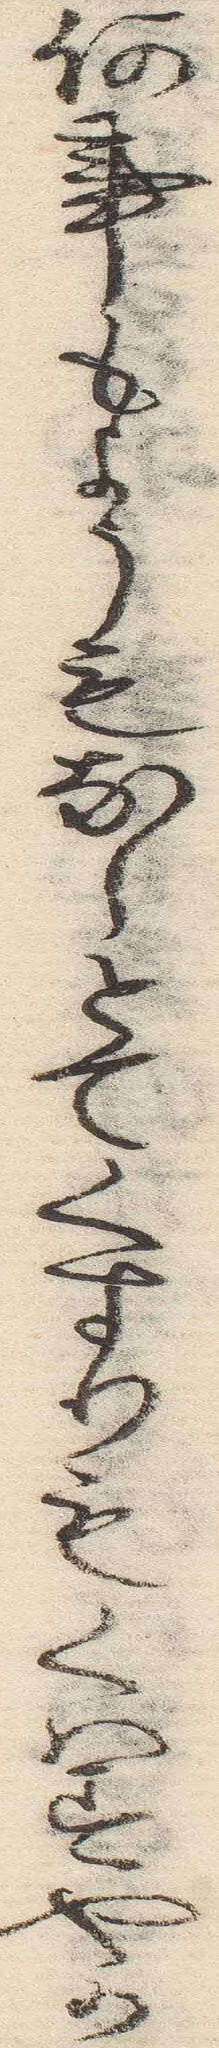何事もようもなしとてくすりもくはすやか
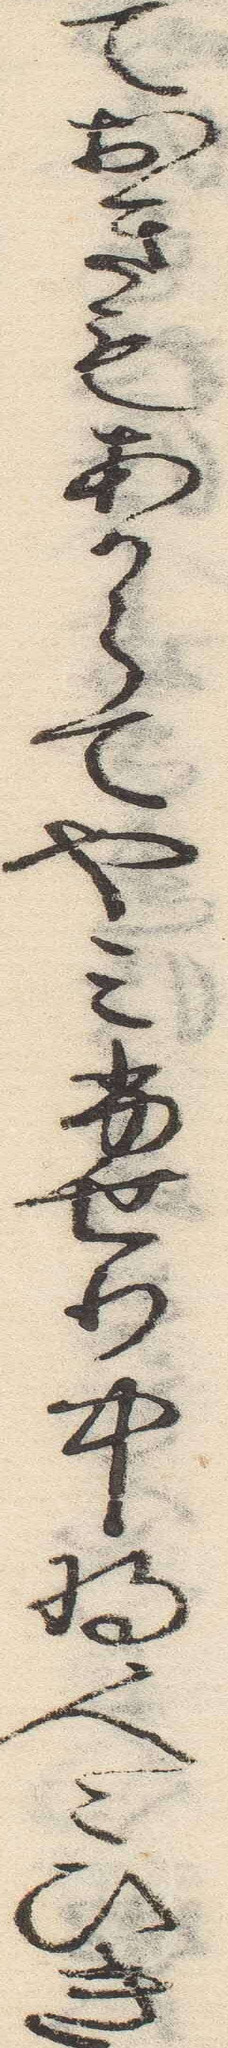ておきもあからてやみふせり中将人々ひき
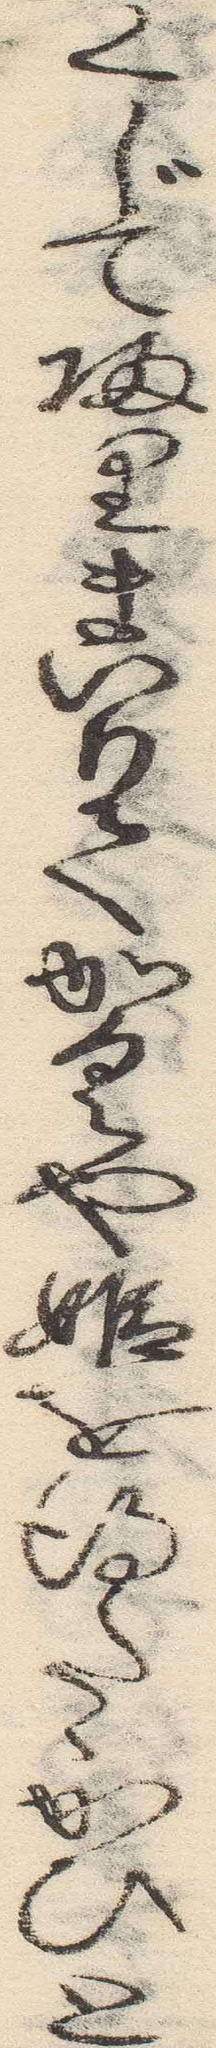くじて帰りまいりてかくや姫を得たゝかひと
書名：竹取物語
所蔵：東京学芸大学附属図書館 国文学研究資料館
